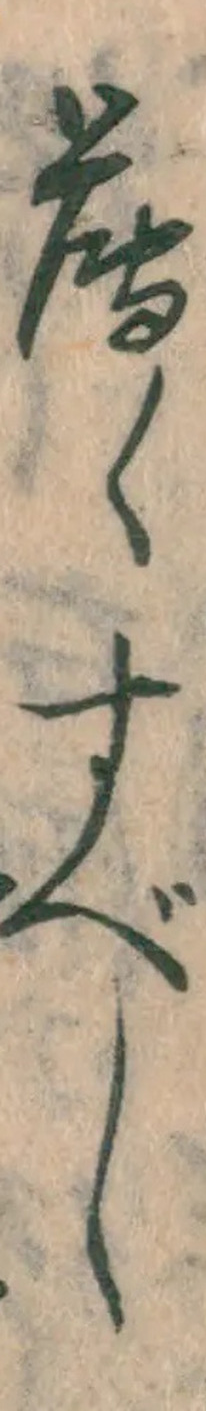薄くすべし
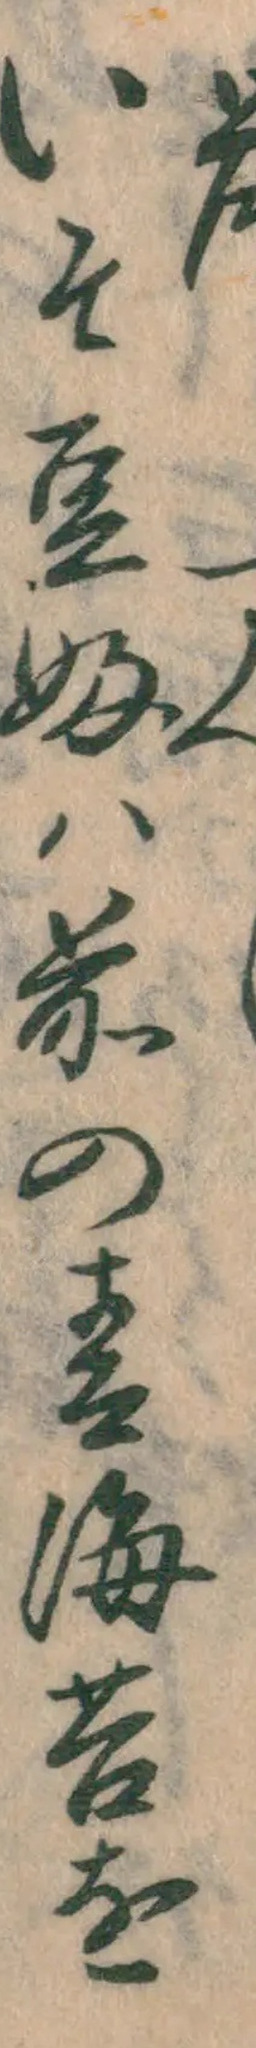いそ豆ふは前の青海苔を
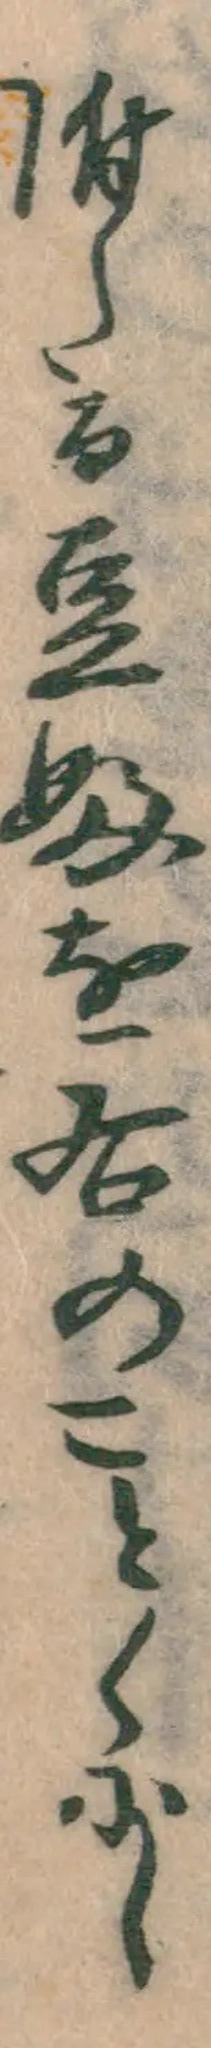附たる豆ふを右のことくにし
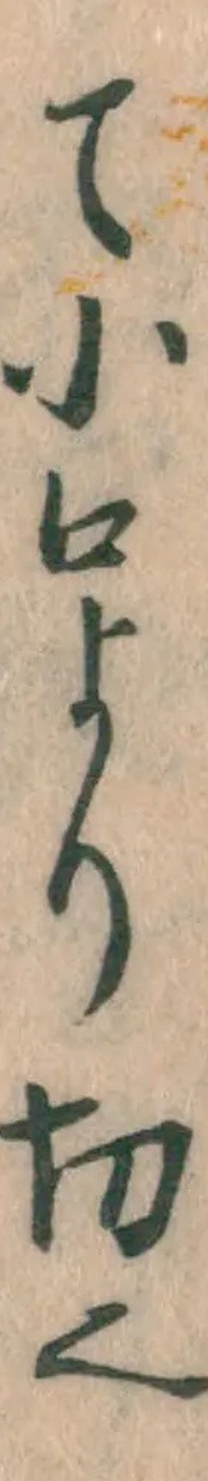て小口より切也
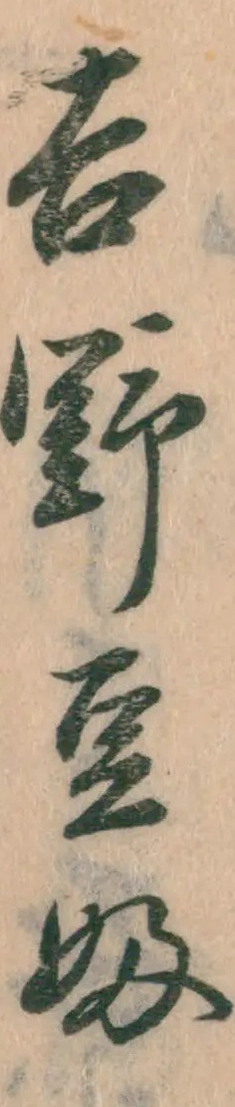吉野豆ふ
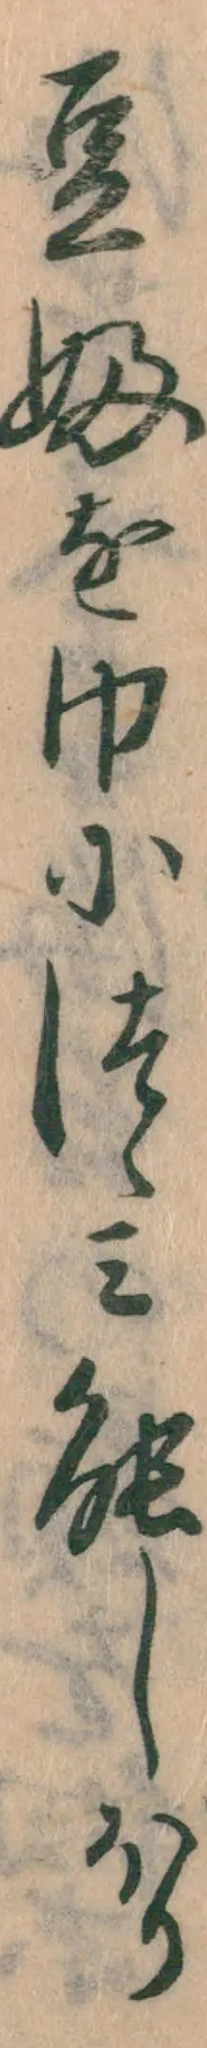豆ふを巾につゝみ能しぼり
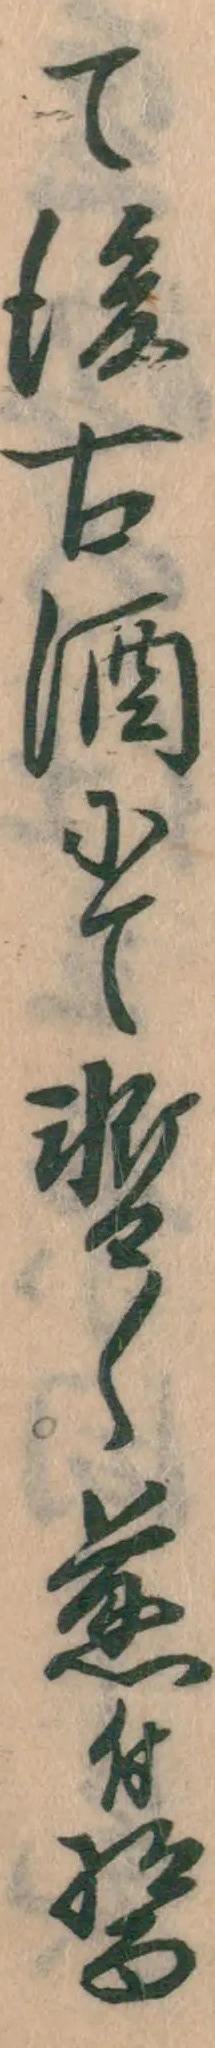て後古酒にて暫く煎付醤
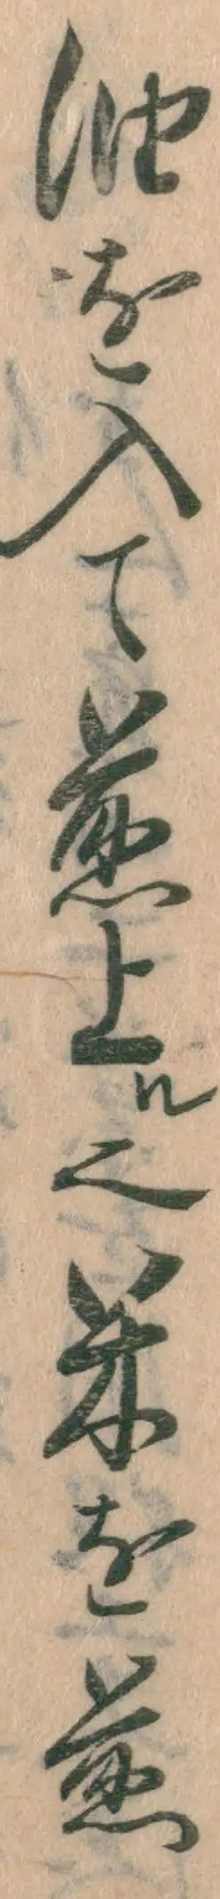油を入て煎上る也米を煎
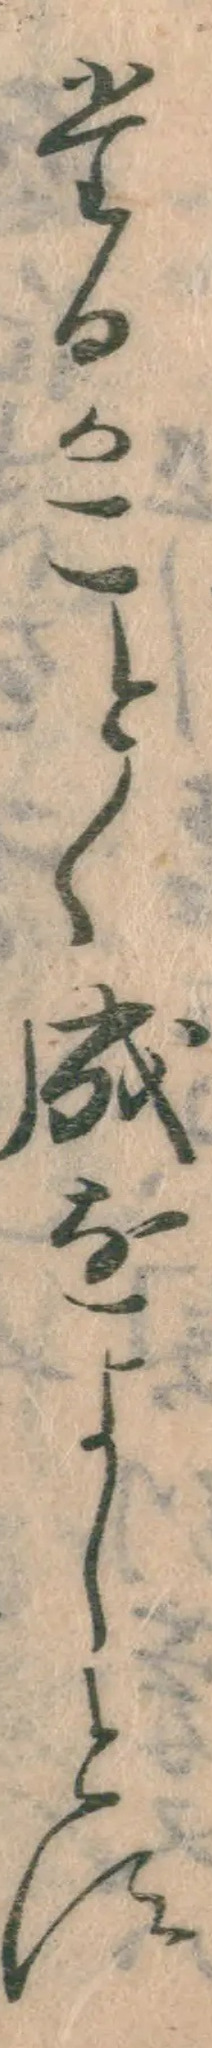たるかことく成をよしとす
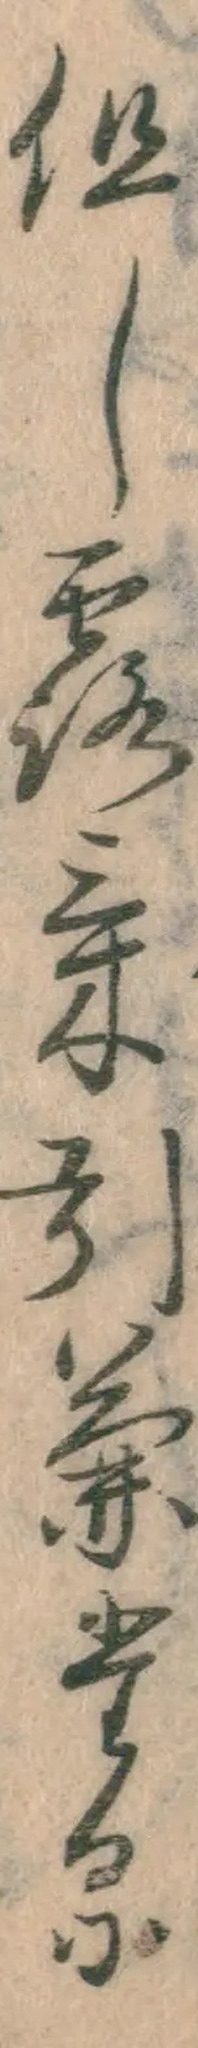但し露気引兼たるに
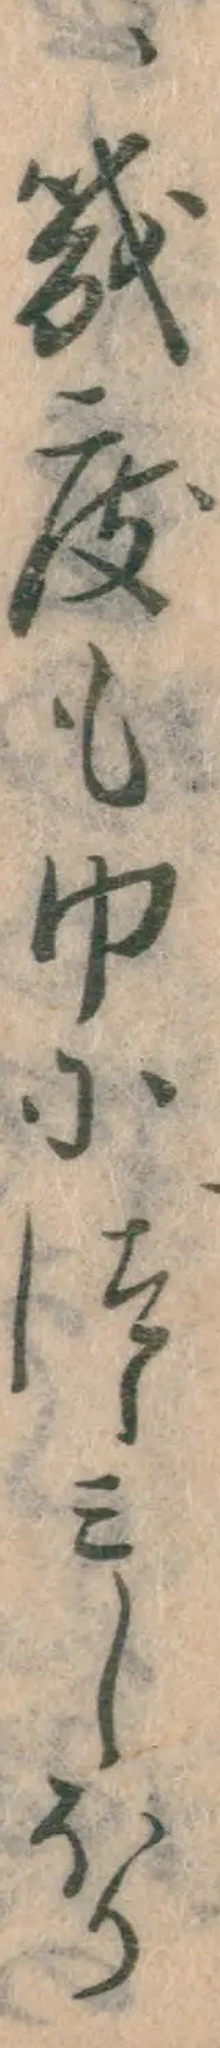は幾度も巾につゝみしほり
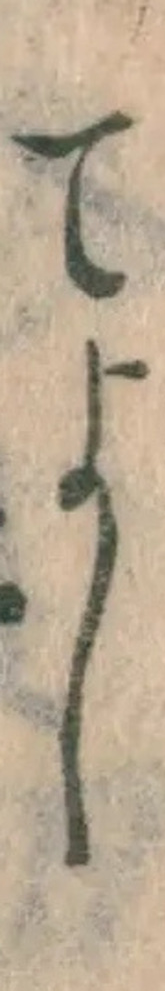てよし
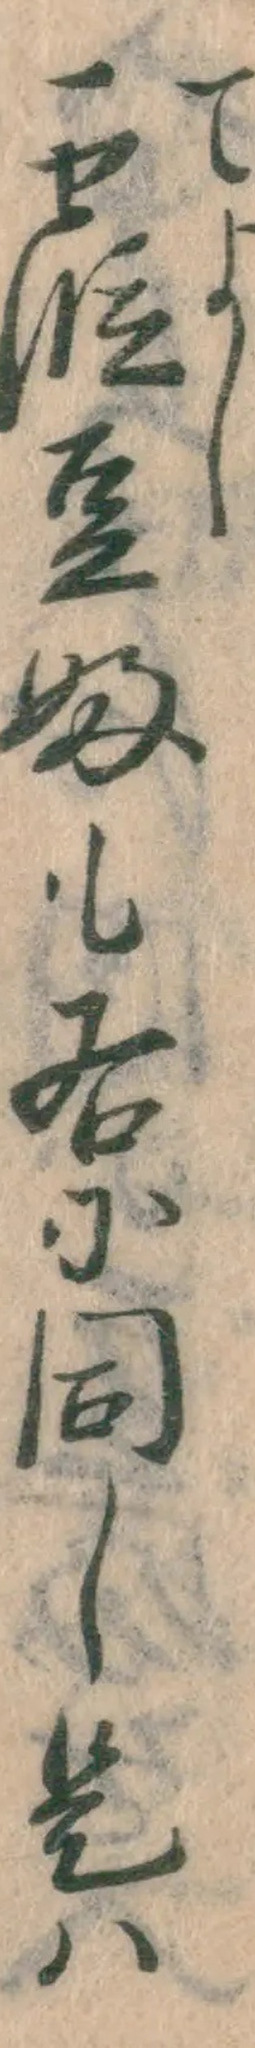霞豆ふも右に同し是は
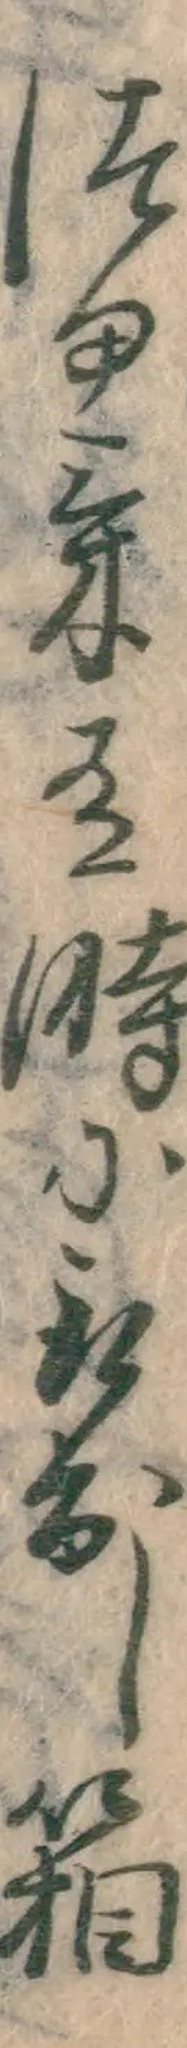つゆ気有時に取出し箱
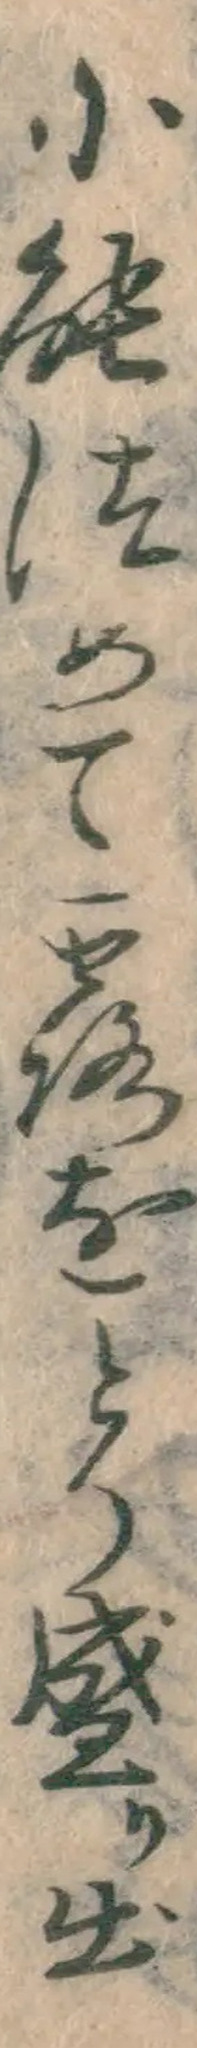に能つめて露をとり盛り出
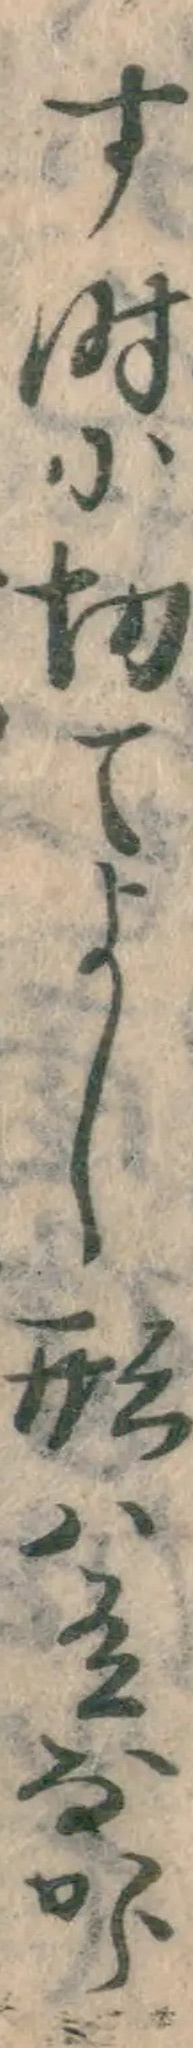す時に切てよし形は有なから
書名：豆腐百珍余録
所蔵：国立国会図書館 National Diet Library, JAPAN
